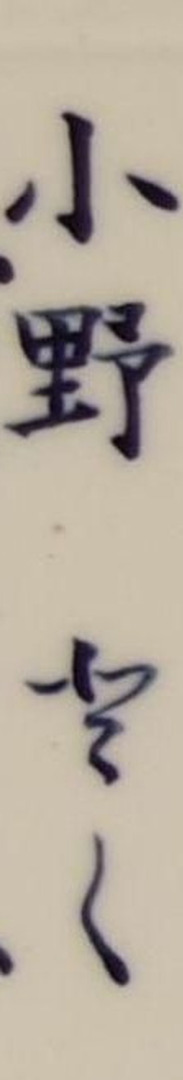小野とく
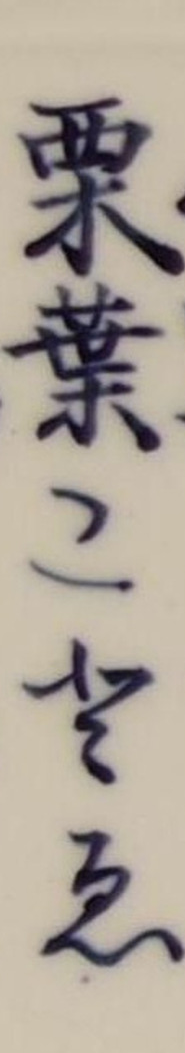栗葉ことえ
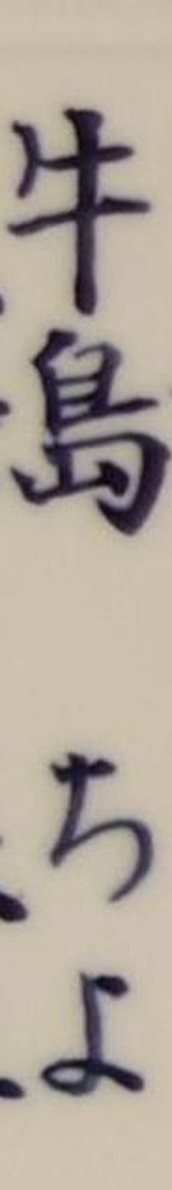牛島ちよ
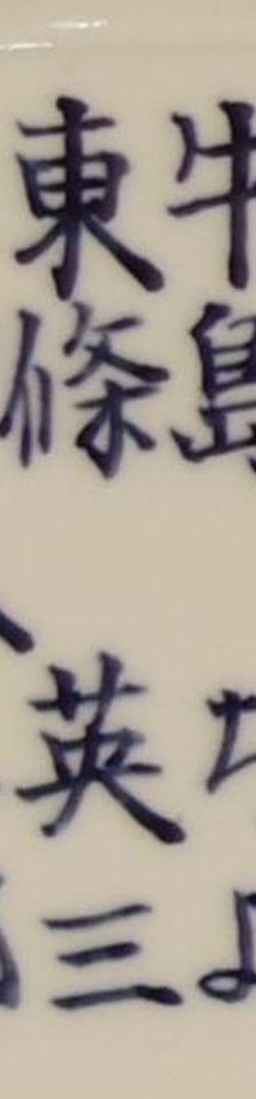東條英三
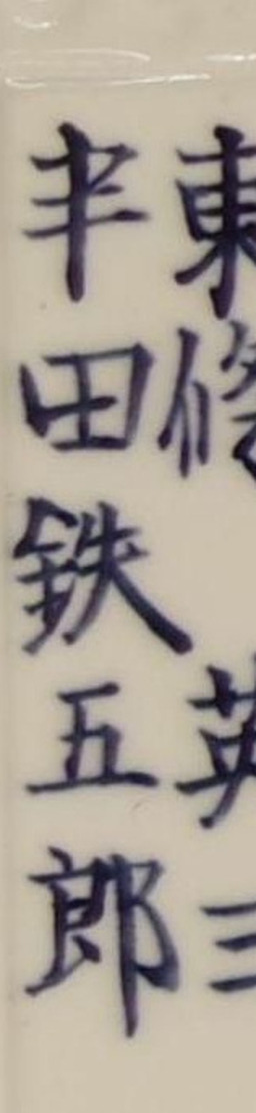半田鉄五郎

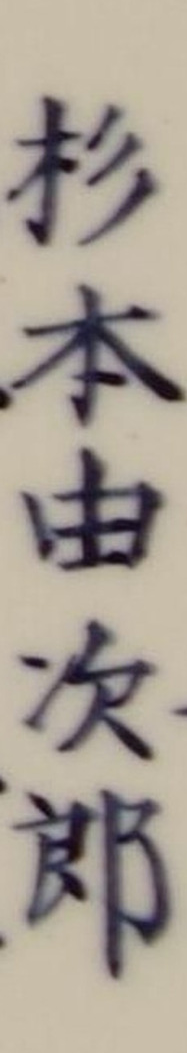杉本由次郎
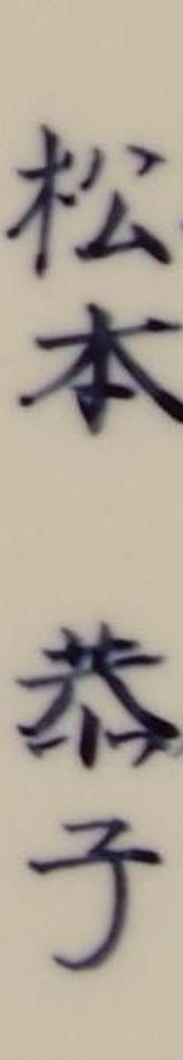松本恭子
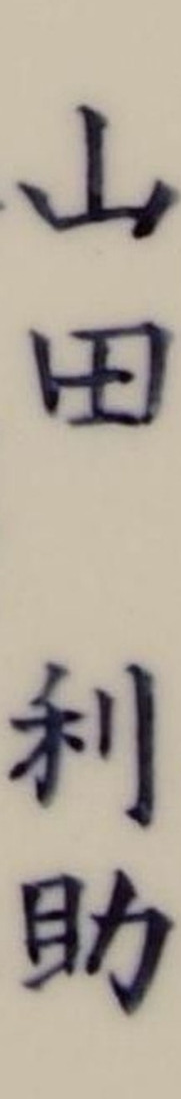山田利助
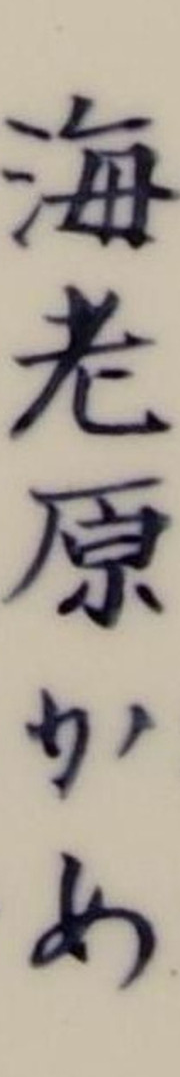海老原かめ
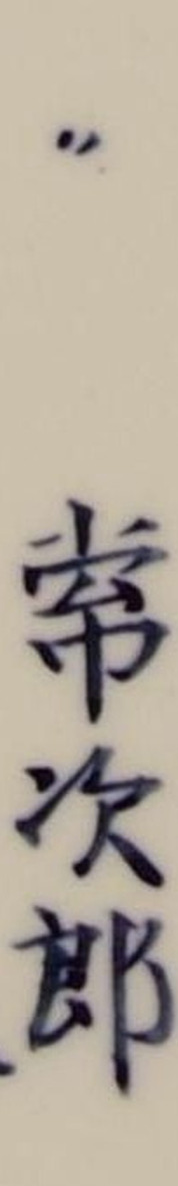常次郎
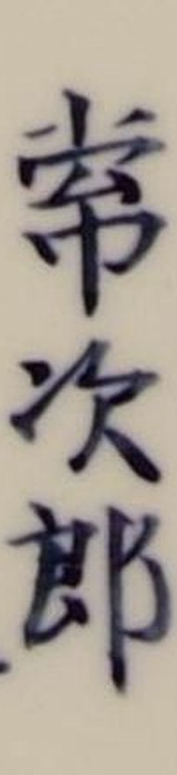常次郎
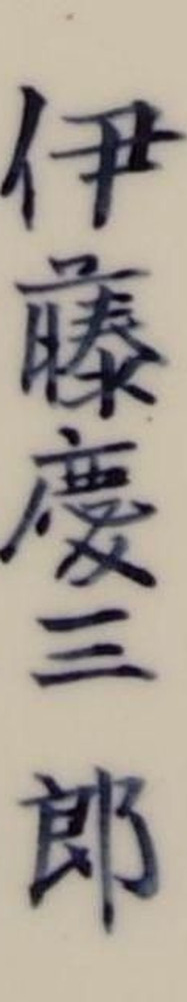伊藤慶三郎
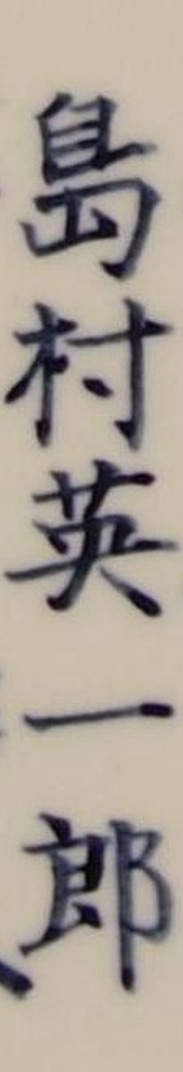島村英一郎
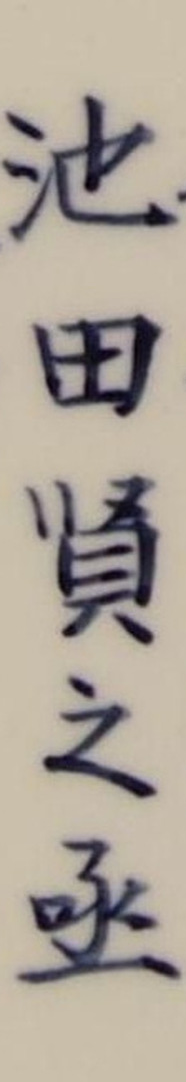池田賢之丞
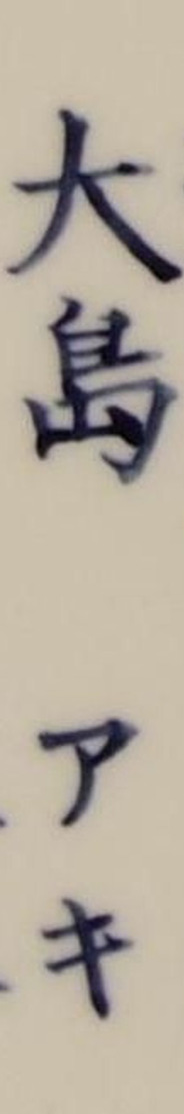大島アキ
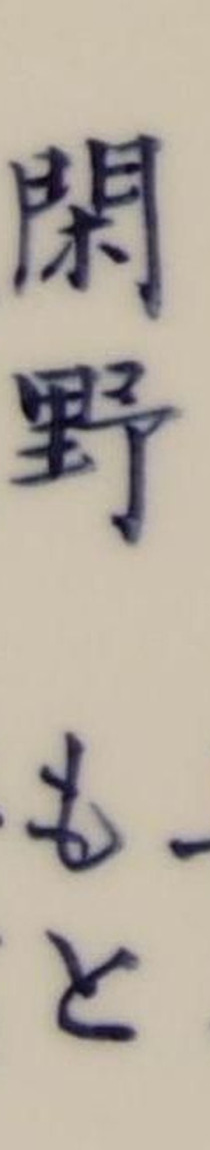閑野もと
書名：M~S
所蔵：高野山金剛峯寺
